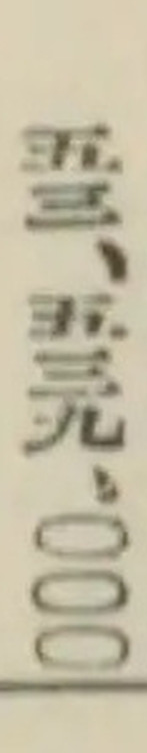計五三、五三九、〇〇〇
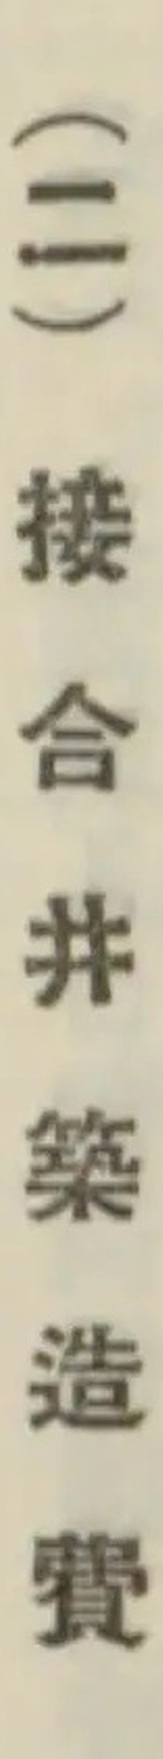(ニ)接合井築造費
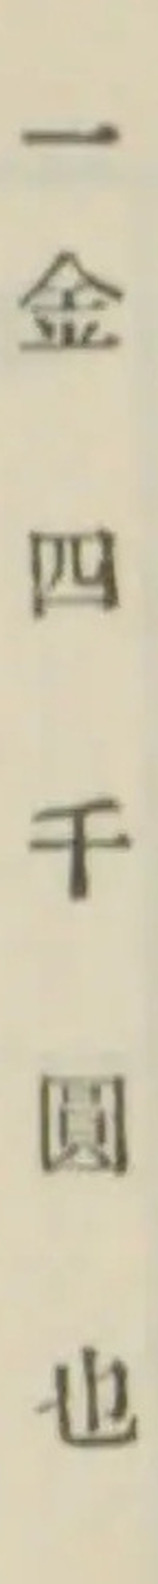一金四千円也

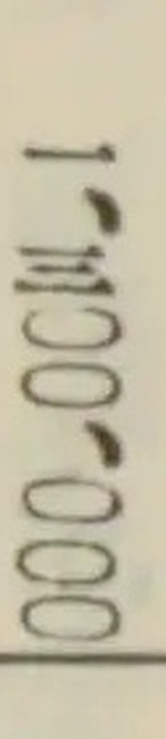計四、〇〇〇、〇〇〇
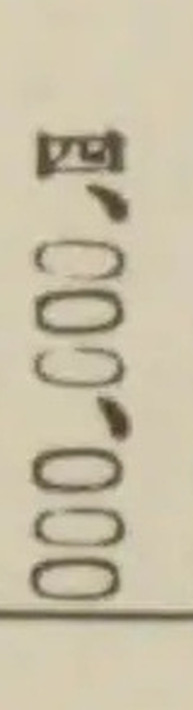計四、〇〇〇、〇〇〇
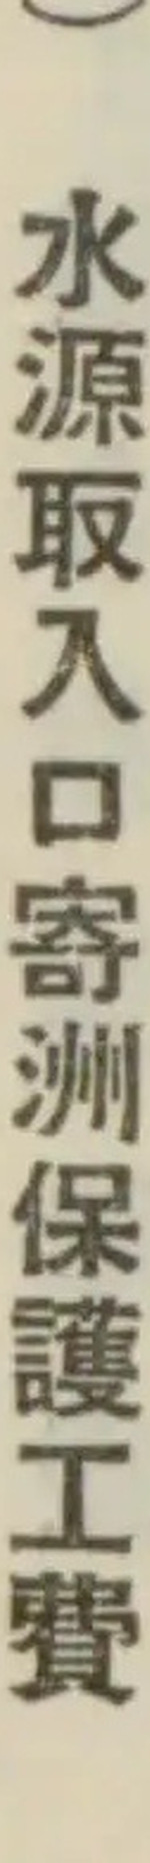(三)水源取入口寄洲保護工費
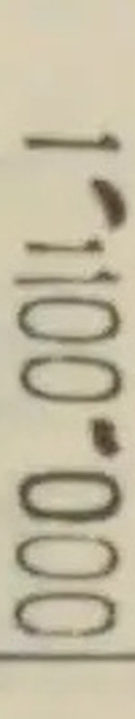水替費二〇〇、〇〇〇
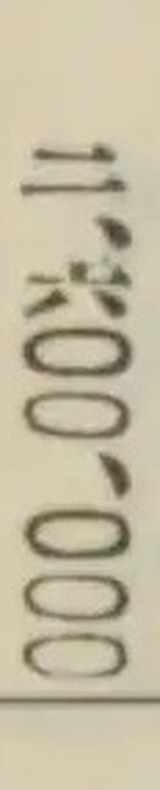計二、六〇〇、〇〇〇
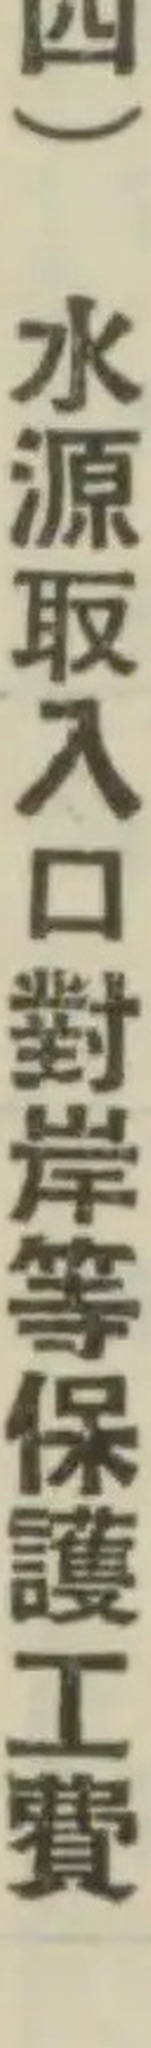(四)水源取入口対岸等保護工費
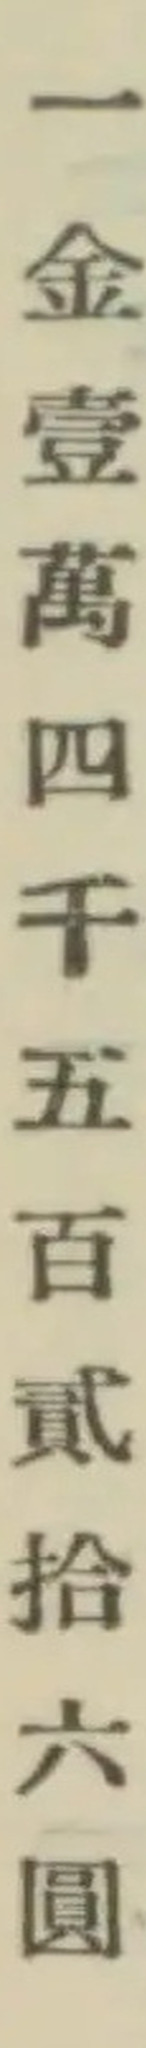一金壱萬四千五百弐拾六円
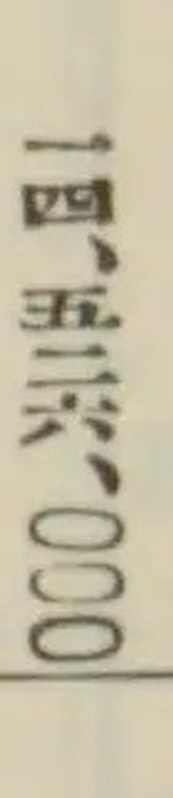計一四、五二六、〇〇〇
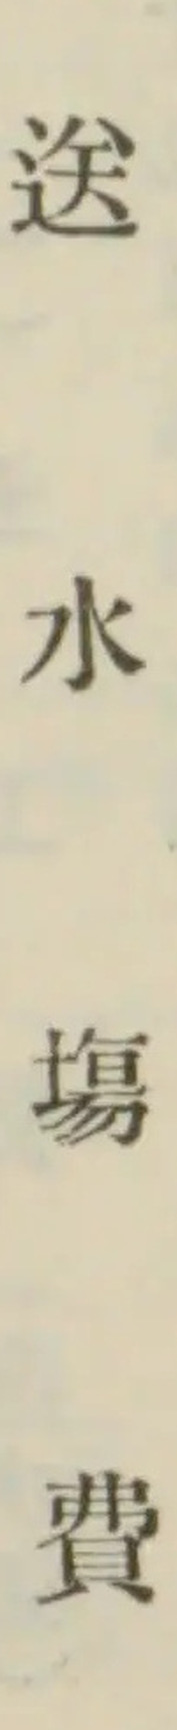送水場費
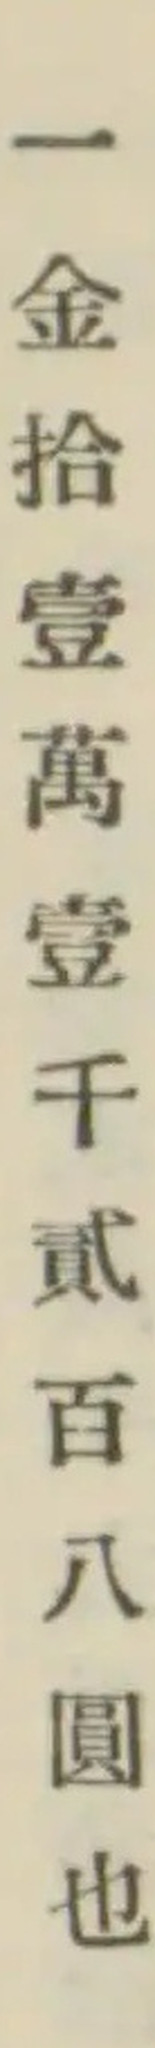一金拾壱萬壱千弐百八円也
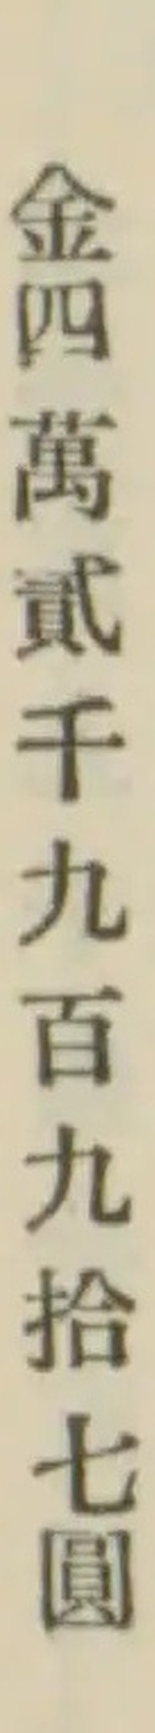金四萬弐千九百九拾七円

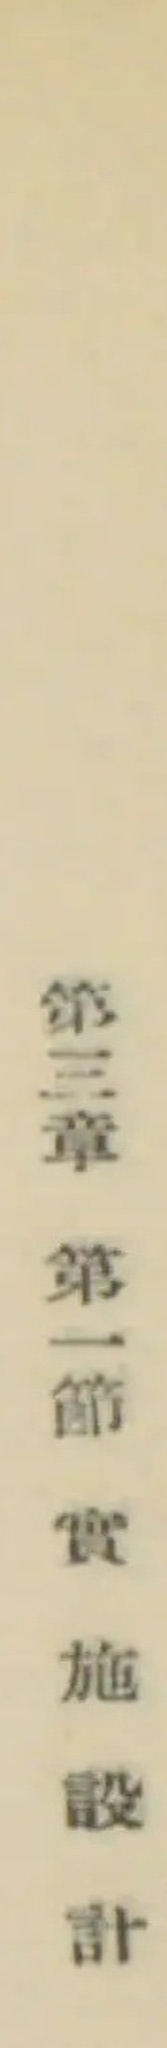第三章第一節実施設計
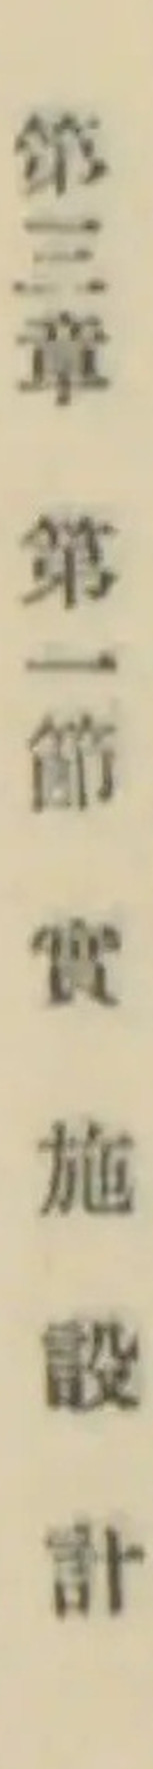第三章第一節実施設計
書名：豊橋市水道誌
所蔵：国立国会図書館 National Diet Library, JAPAN
